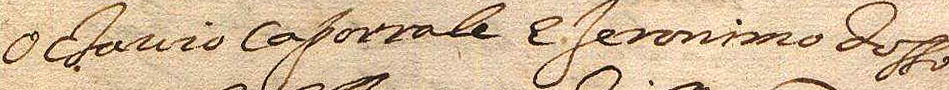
octauio caporrale E Jeronimo dosso
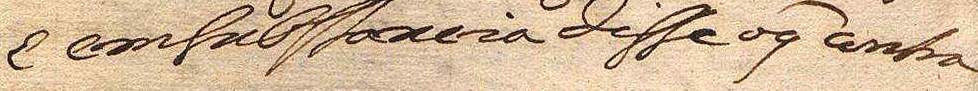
E em substancia disse o q̄ contra
